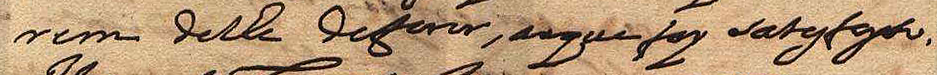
rem de lhe deferir, ao que foy satisfeyto.
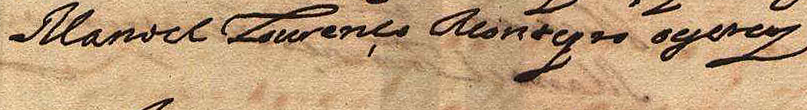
Manoel Lourenço Monteyro o escreuj
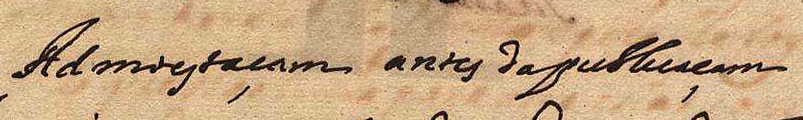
Admoestaçam antes da publicaçam
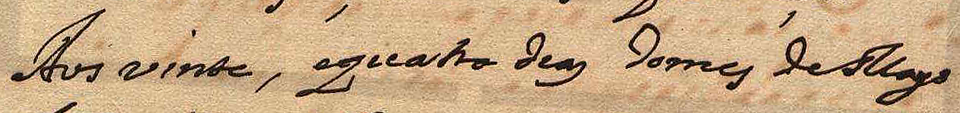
Aos vinte, e quatro dias do mes de Mayo
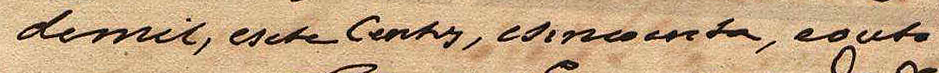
de mil, e setecentos, e sincoenta, e outo
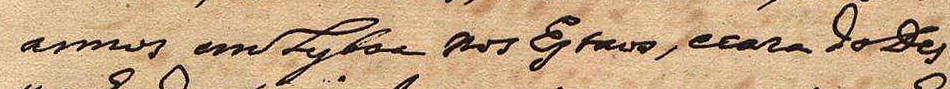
annos em Lisboa nos Estaos, e caza do Des
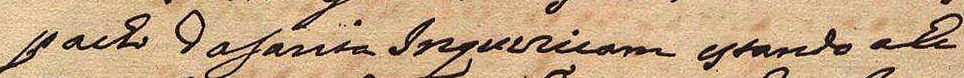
pacho da santa Inquiziçam estando ahi
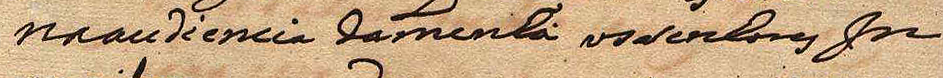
na audiencia da menhã os senhores Jn
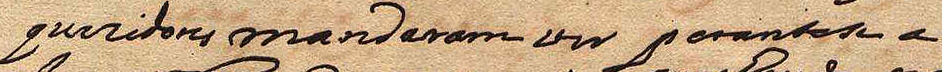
quizidores mandaram vir perante si a
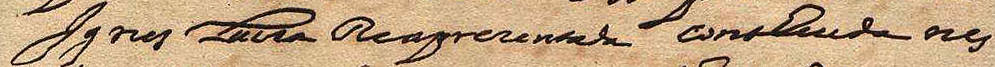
Jgnes Luiza Re aprezentada contheuda nes
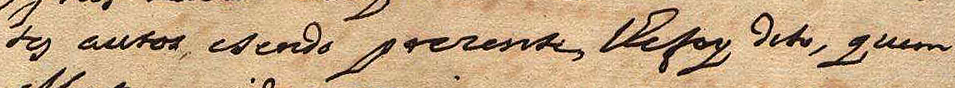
tes autos, e sendo prezente lhe foy dito, quem
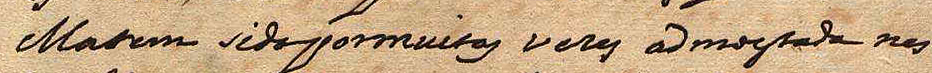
ella tem sido por muitas vezes admoestada nes
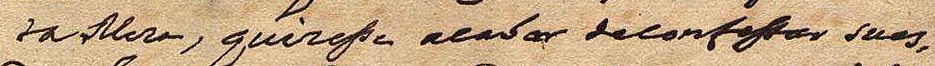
ta Meza, quizesse acabar de confessar suas,
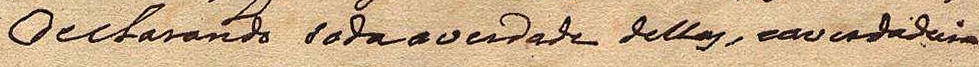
declarando toda a verdade dellas, e a verdadeira
